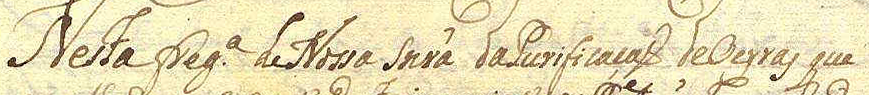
Nesta freg.a de Nossa Snrā da Purificaçaõ de Oeyras que
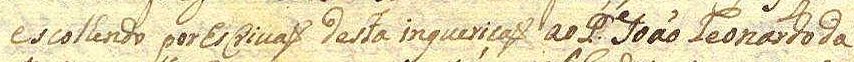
escolhendo por EsCriuaõ desta inqueriçaõ ao P.e Ioão Leonardo da
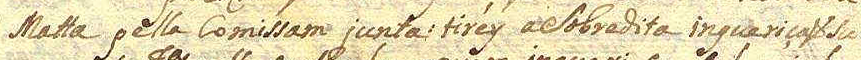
Matta pella Comissam junta: tirey a Sobredita inqueriçaõ su
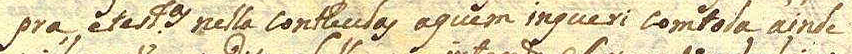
pra, e test.as nella contheudas a quem inqueri com toda a inde
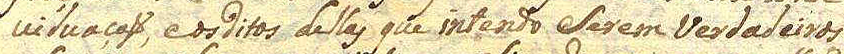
uiduaçaõ, e os ditos dellas que intendo Serem verdadeiros
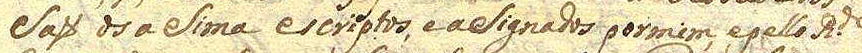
Saõ os aSima escriptos, e aSignados por mim, e pello R.do
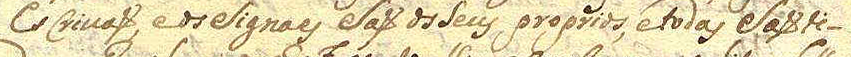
EsCriuaõ, e os Signaes Saõ os seus proprios, e todas Saõ ti
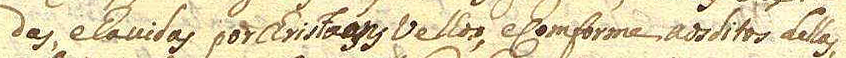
das, e hauidas por christaons velhos, e Comforme aos ditos dellas,
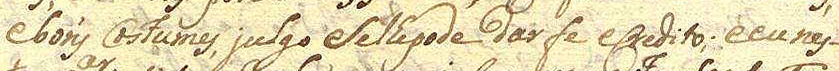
e bons Costumes, julgo Se lhe pode dar fe e Credito; e eu nes
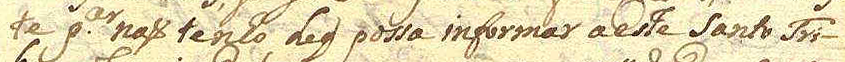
te p.ar naõ tenho de q̄ possa informar a este santo Tri
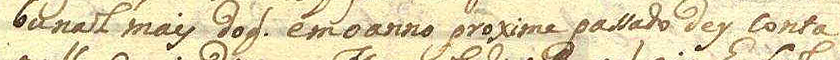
bunal mais do q̄. em o anno proxime passado dey conta
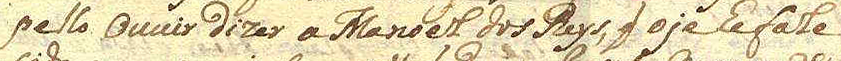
pello Ouuir dizer a Manoel dos Reys, q̄ oje he fale
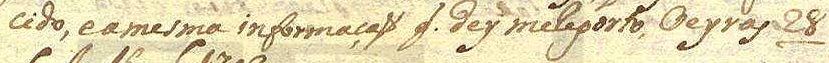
cido, e a mesma informaçaõ q̄. dey me Reporto, Oeyras 28
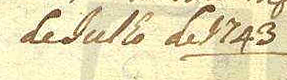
de Iulho de 1743
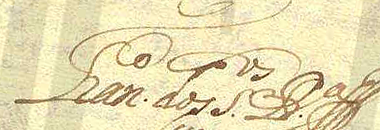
Fran.co dos S.tos Pr.a
